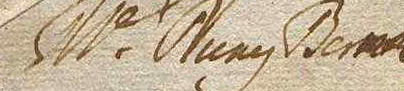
M.el Nunes Ber
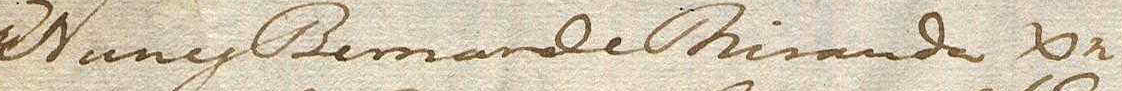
Nunes Bemar de Miranda x n
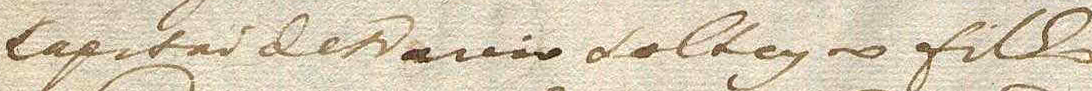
capitaõ de Navio solteyro filho
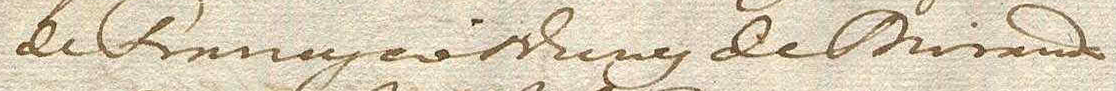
de Francisco Nunes de Miranda
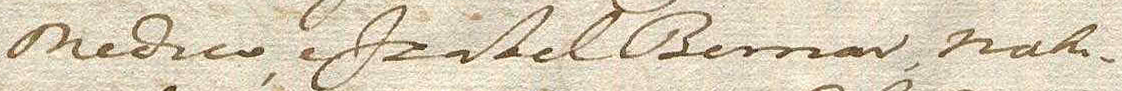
medico, e Jzabel Bemar, natu
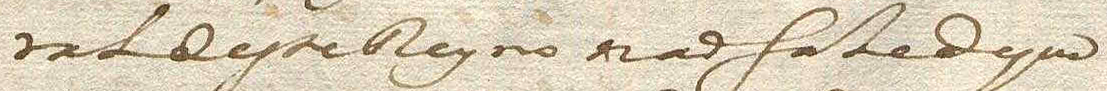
ral deste Reyno naõ sabe de que
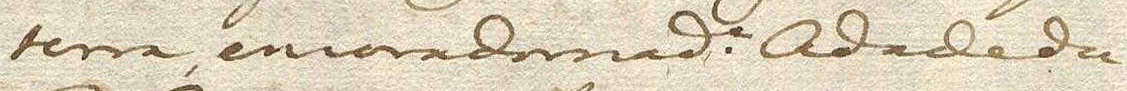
terra, e morador na d.a cidade da
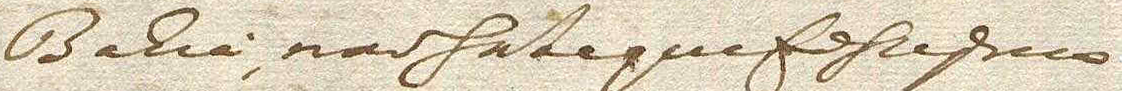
Bahia, naõ sabe que fosse prezo
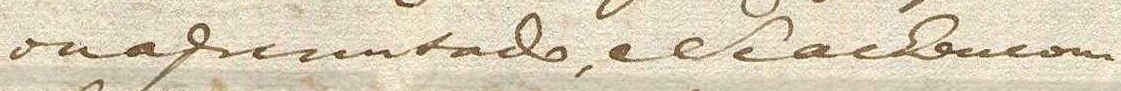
ou aprezentado, e se achou com
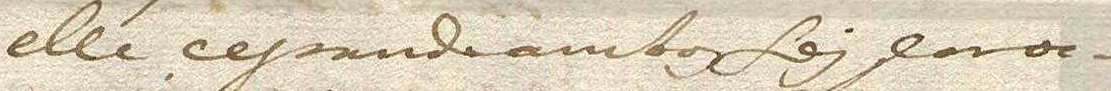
elle, e estando ambos foj por oc
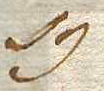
19
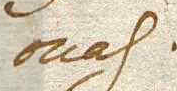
occas.
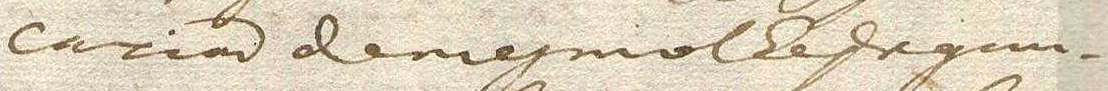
caziaõ de mesmo lhe pregun
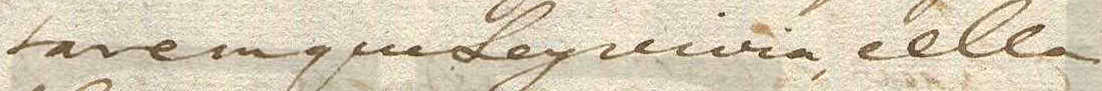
tar em que Ley vivia, e ella
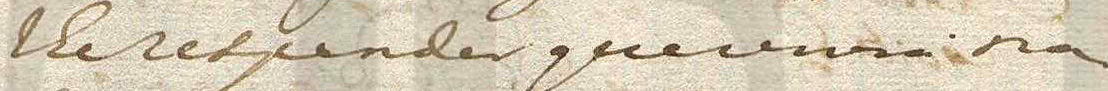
lhe responder que vivia na
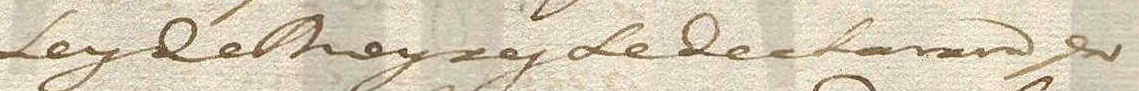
Ley de Moyzes se declararaõ por
